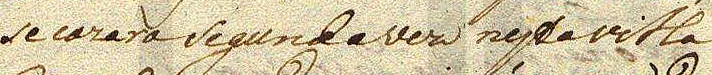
se cazara segunda vez nesta villa
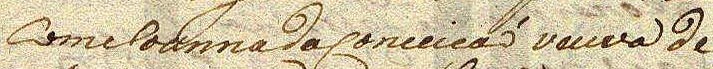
Com Ioanna da Conceiçaõ veuva de
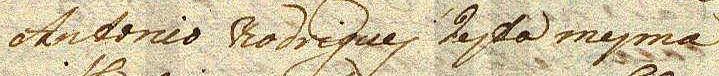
Antonio Rodrigues desta mesma
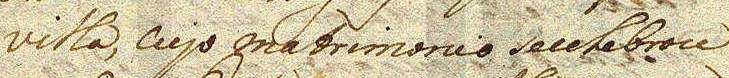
villa, cujo matrimonio se celebrou
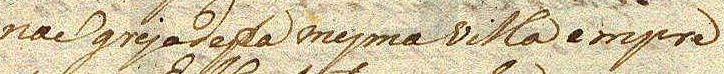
na Igreja desta mesma villa em pre
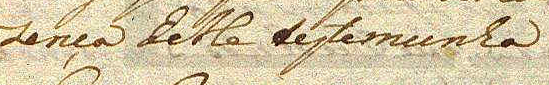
zença delle testemunha
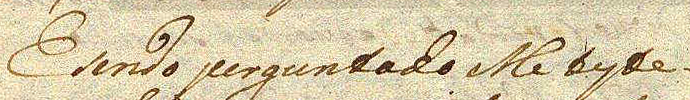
E sendo perguntado elle teste
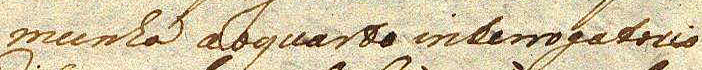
munha ao quarto interrogatorio
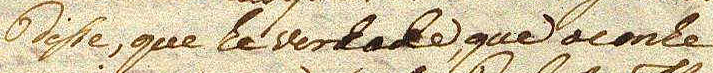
disse, que he verdade, que o conhe
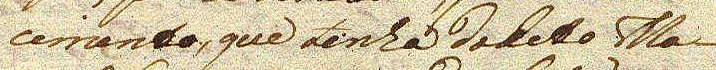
cimento, que tinha do deto Ma
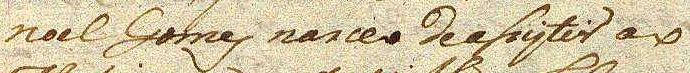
noel Gomes nasceo de assistir ao
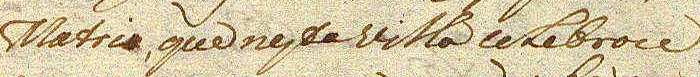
Matrio, que nesta villa celebrou
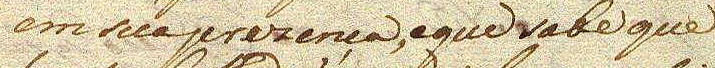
em sua prezença, e que sabe que
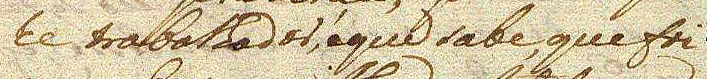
he trabalhador, e que sabe que foi
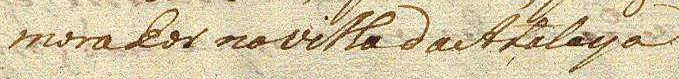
morador na villa da Atalaya
